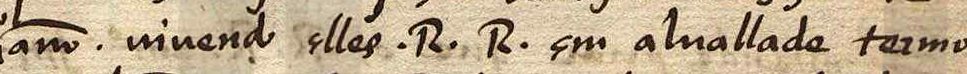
āno . uiuendo Elles .R. R. em aluallade termo
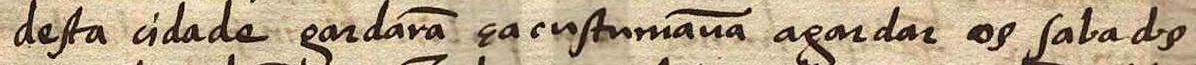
desta çidade gardar̄a E acustumāua agardar os sabados
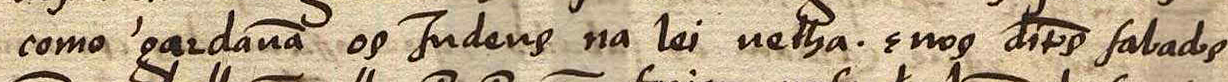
como gardaūa os Judeus na lei uelha. E nos ditos sabados
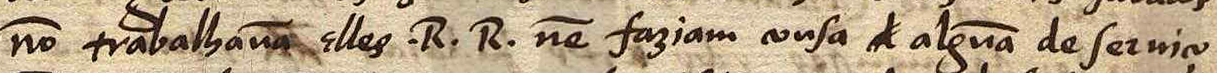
n̄o trabalhaūa Elles .R. R. n̄e faziam cousa d alḡua de seruiço
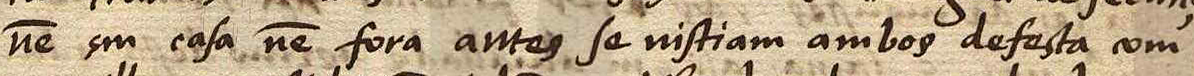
n̄e Em casa n̄e fora antes se uistiam ambos de festa com
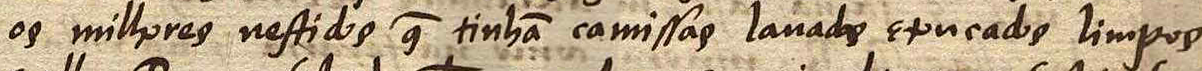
os milhores uestidos q̄ tinhā camissas lauadas E toucados limpos
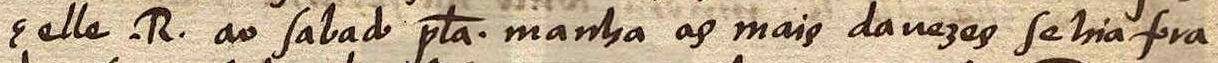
E elle .R. ao sabado p̄la. manha as mais da uezes se hia fora
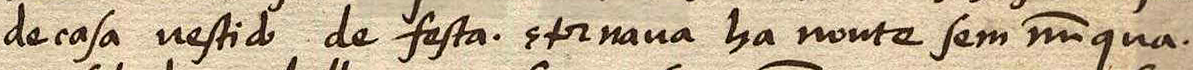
de casa uestido de festa. E tornaua ha noute sem n̄uqua.
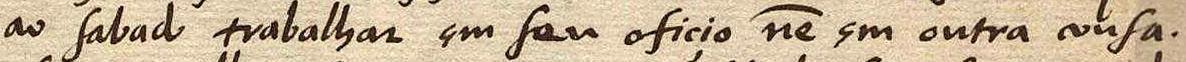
ao Sabado trabalhar Em seu ofiçio n̄e Em outra cousa.
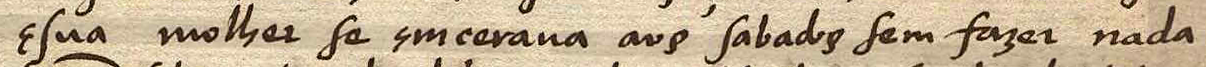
E sua molher se Emçeraua aos sabados sem fazer nada
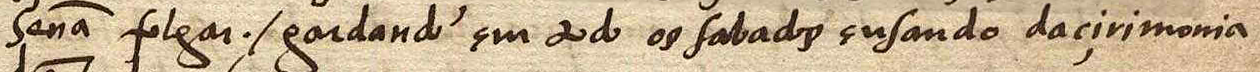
sen̄a folgar ./ gardando Em todo os sabados E usando da çirimonia
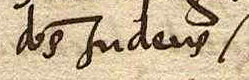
dos Judeus /
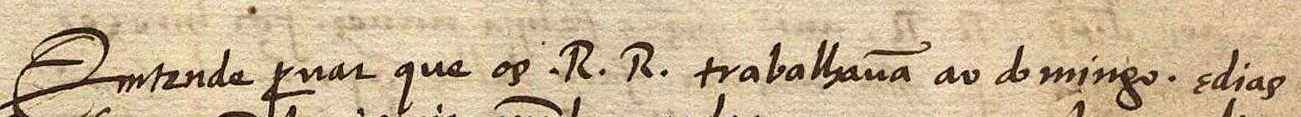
Emtende ꝓuar que os .R. R. trabalhaūa ao domingo. E dias
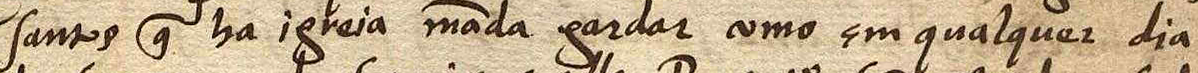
santos q̄ ha igreia m̄ada gardar como Em qualquer dia
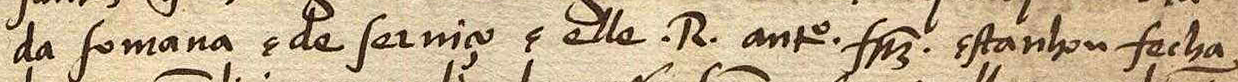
da somana E de seruiço E elle .R. anto. fr̄rz. Estanhou fecha
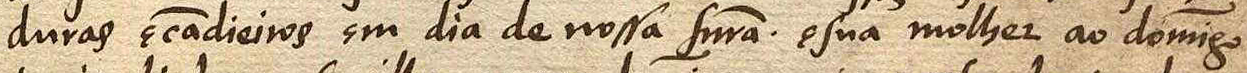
duras E c̄adieiros Em dia de nossa Snr̄a. E sua molher ao dom̄igo
